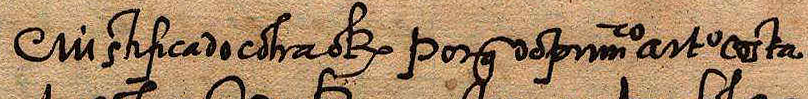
e iustificado cōtra o Rꝭ porq̄ do primro arto cos̄ta
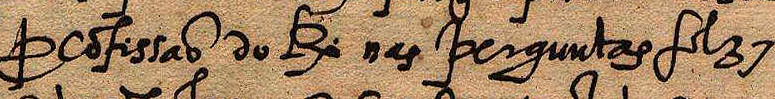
ꝓ cōfissaõ do Rꝭ nas perguntas fol 37
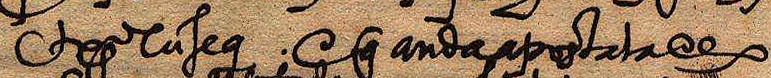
& vso cōseꝗ. e q̄ anda apostata e ex
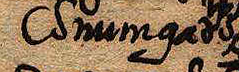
cōmungado
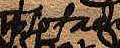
ipso facto
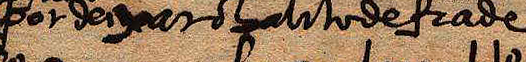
por deixar o habito de frade
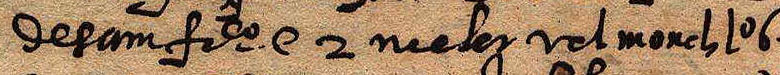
de sam frco. e 2 ne cler vel monch lo 6.
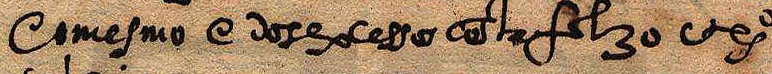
e o mesmo e dos excessos cōsta fol 30 & vso
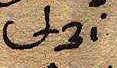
& 3i
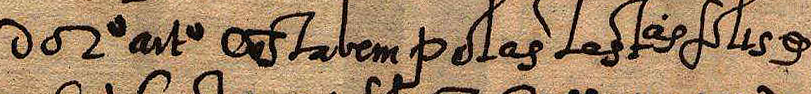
do 2o arto cōsta bem polas testas fol 15 vs
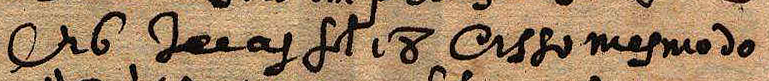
& 6 tee as fol 18 e isto mesmo do
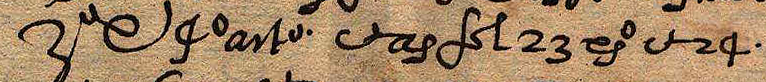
3o e 4o arto. & as fol 23 vso & 24.
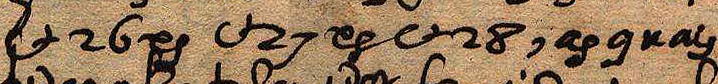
& 26 vs & 27 vs & 28, as quais
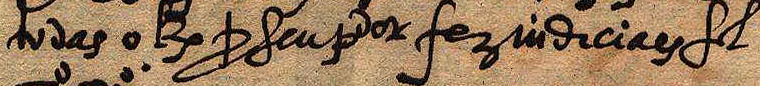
todas o Rꝭ ꝓ seu pdor fez iudiciaes fol
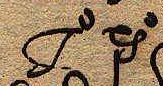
7o vso
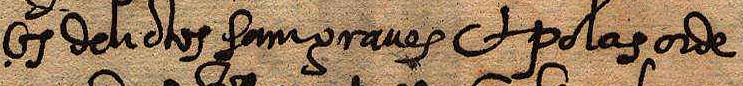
os delictos sam graues & polas orde
